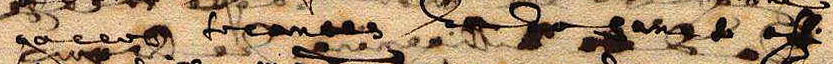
goceos tocantes haho sancto offi
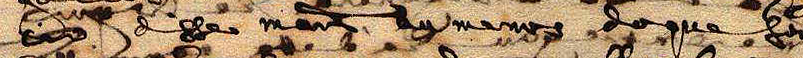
cio disse mais ou menos do que sou
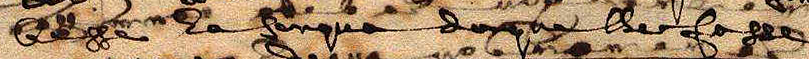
besse haserqua do que lhe fosse
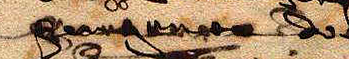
perguntado
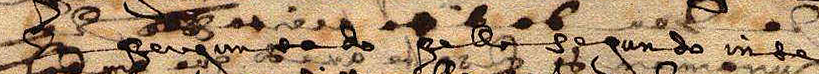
E perguntado pello segundo inte
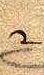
2
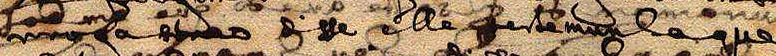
rrogatorio disse elle testemunha que
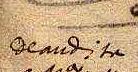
de audita
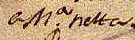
a M.a netta
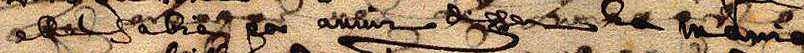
elle sabia por ouuir disser ha maria
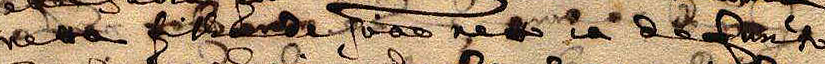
netta filha de joaõ netto ia defunto
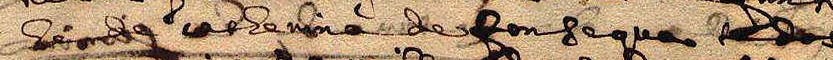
he de catherina de fonsequa todos
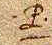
P.
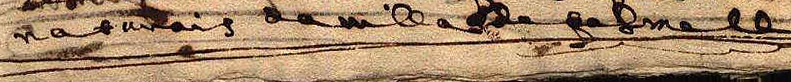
naturais da uilla de palmella
